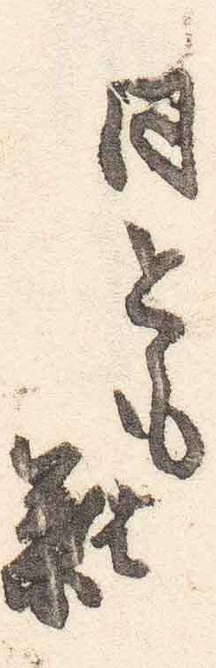同とも花
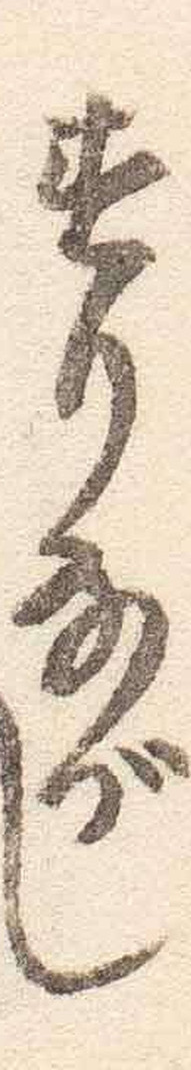すりながし
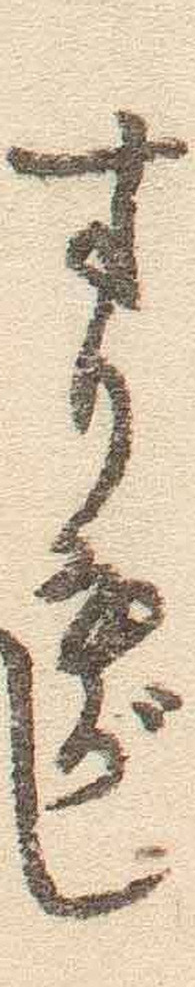すりながし

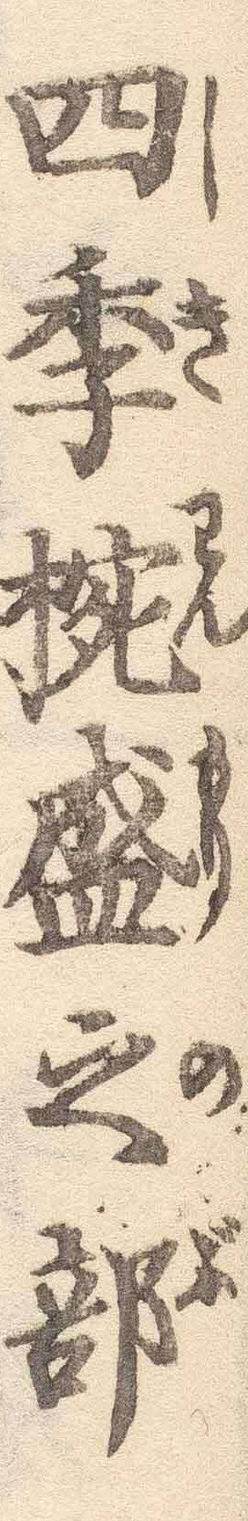四季椀盛之部
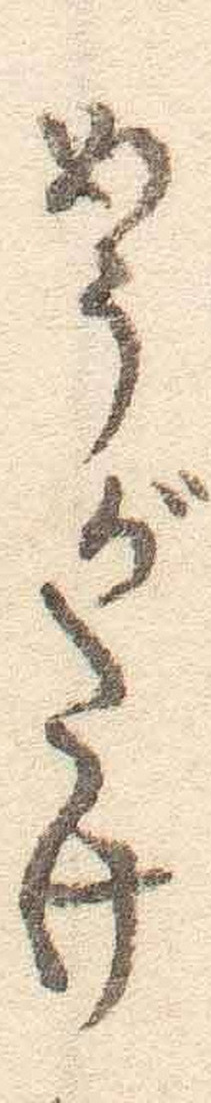めうがたけ
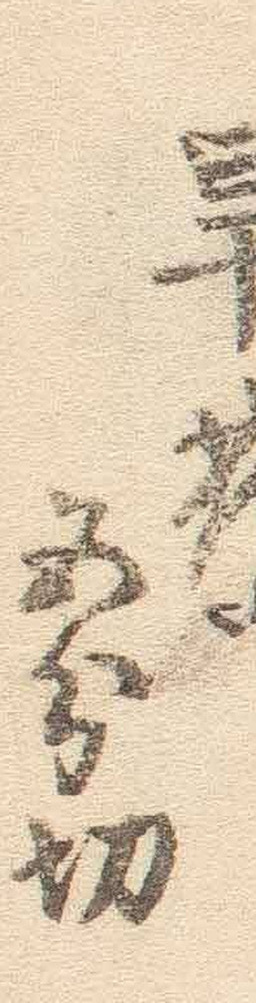五分切
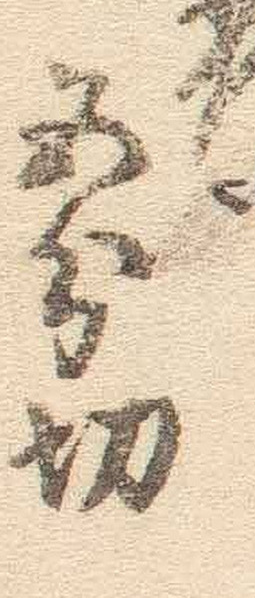五分切

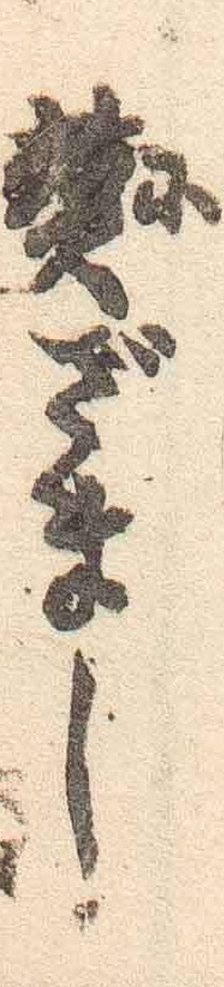煮ざまし
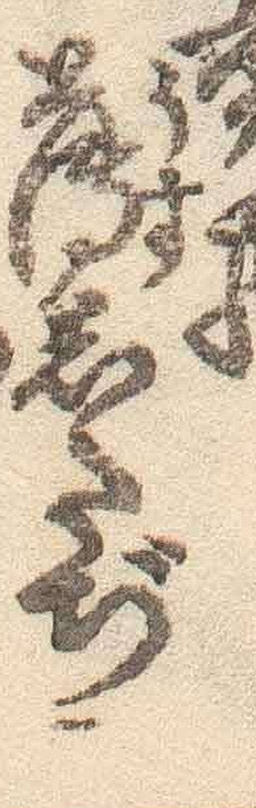うすしたぢ
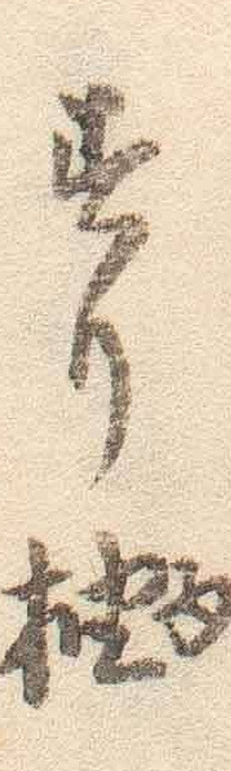すり柚
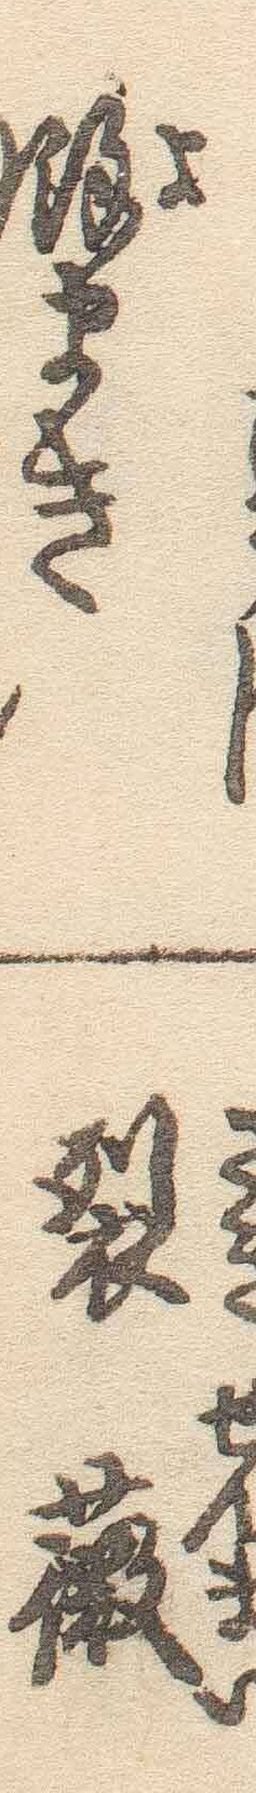余まき裂薇

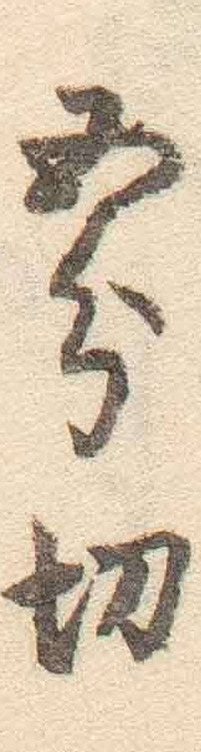五分切
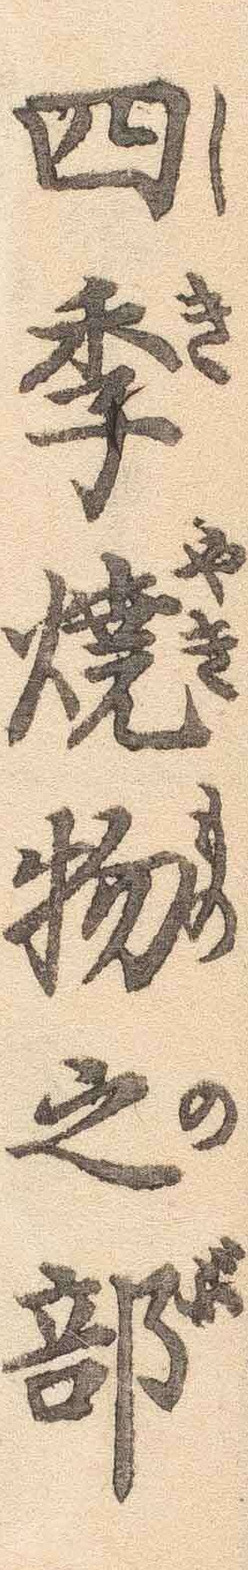四季焼物之部
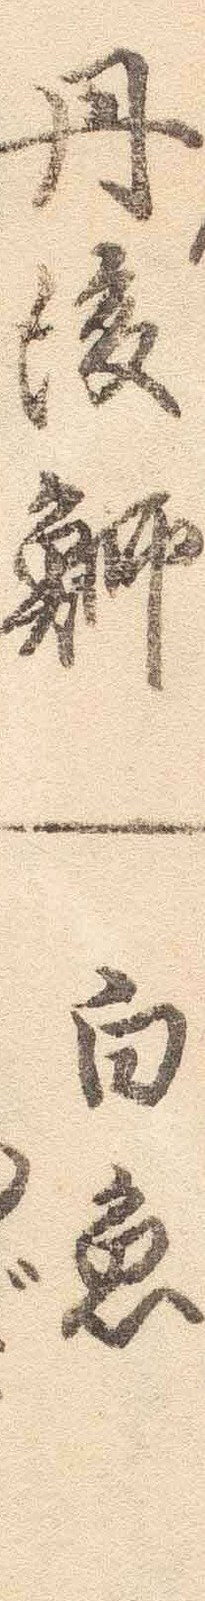丹後鰤白魚
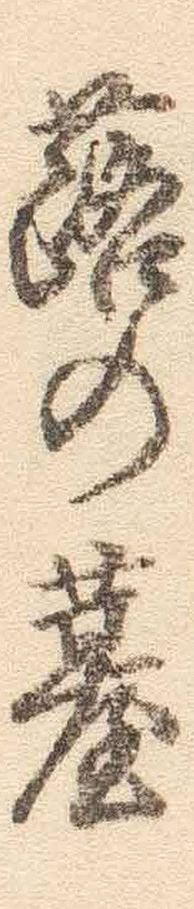蕗の薹
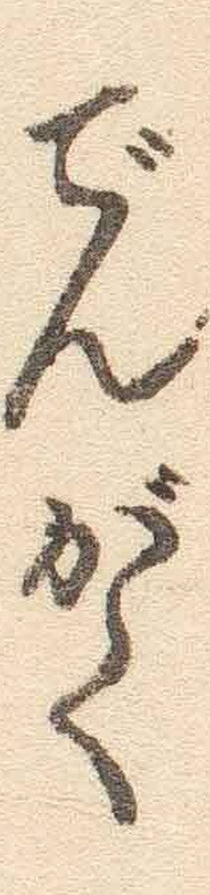でんがく
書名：料理通
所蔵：東京学芸大学附属図書館 国文学研究資料館
